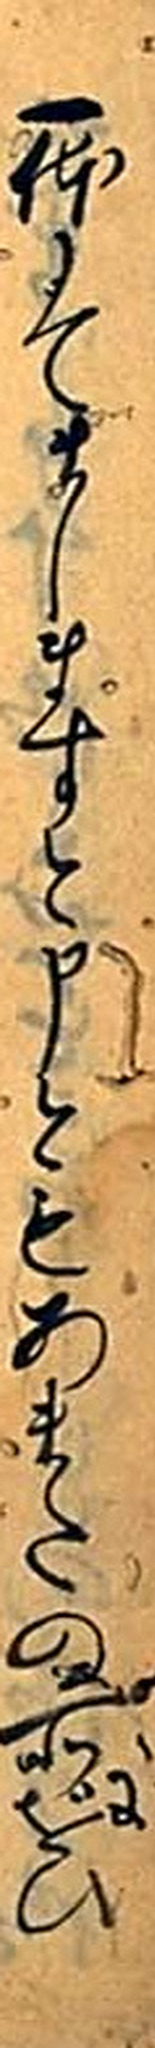一体にてましますと申ともあまたの所にをひ
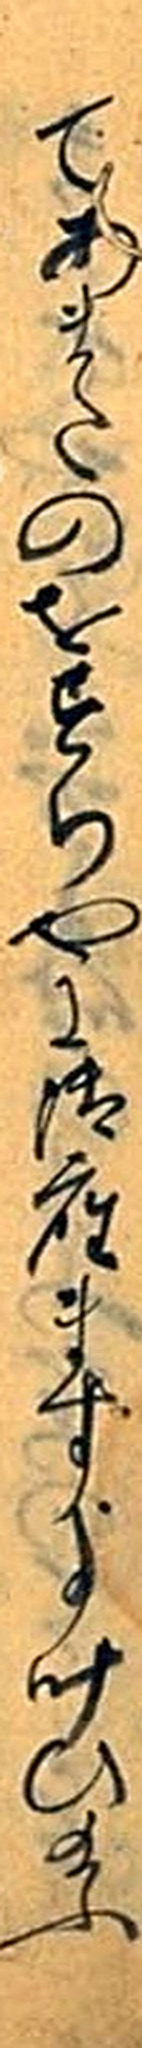てあまたのをすちやに御座ます事叶ひ給ふ
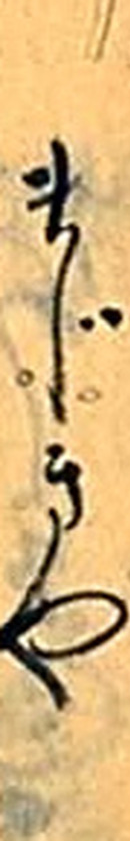まじきや
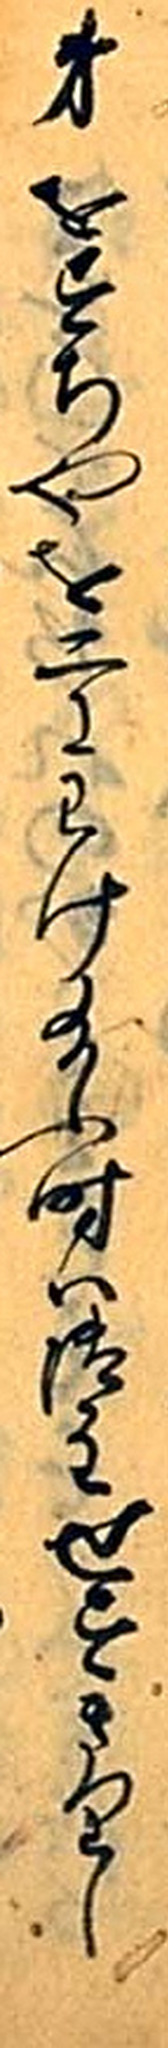弟をすちやを二にわけ給ふ時は御主せすきりし
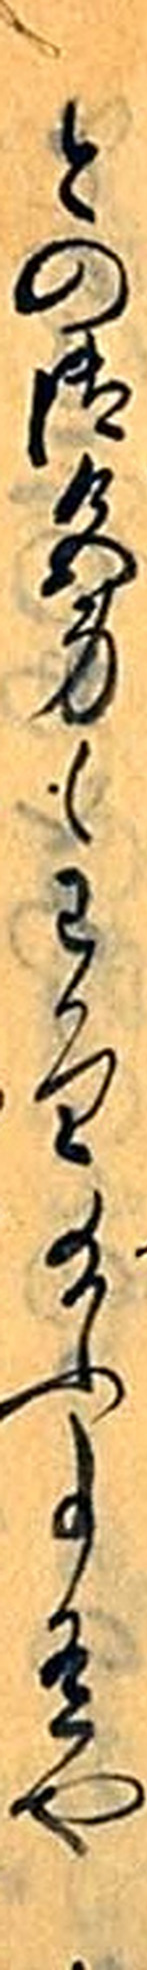との御色身もわかり給ふ事有や
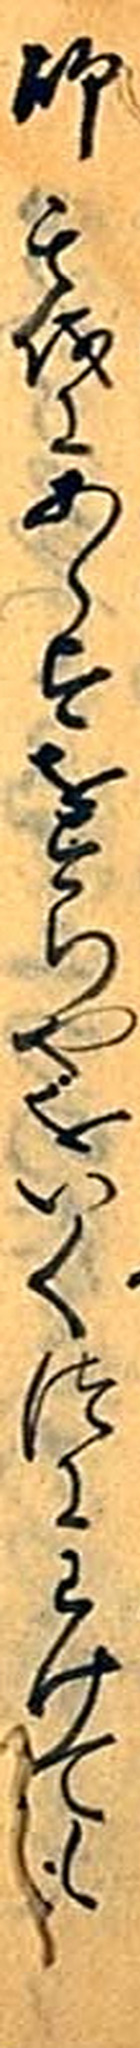師其儀にあらすをすちやをいくつにわけても
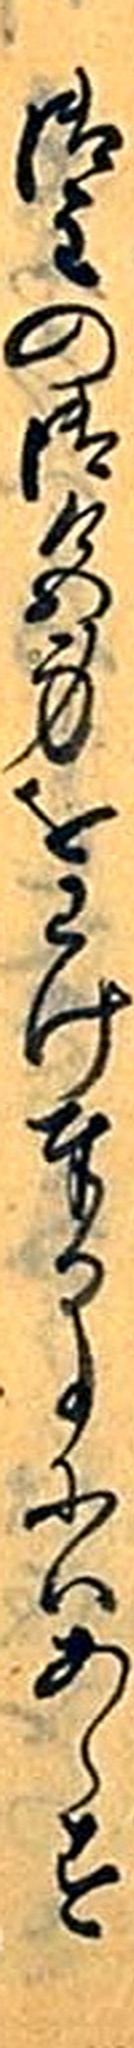御主の御色身をわけ奉る事にはあらす
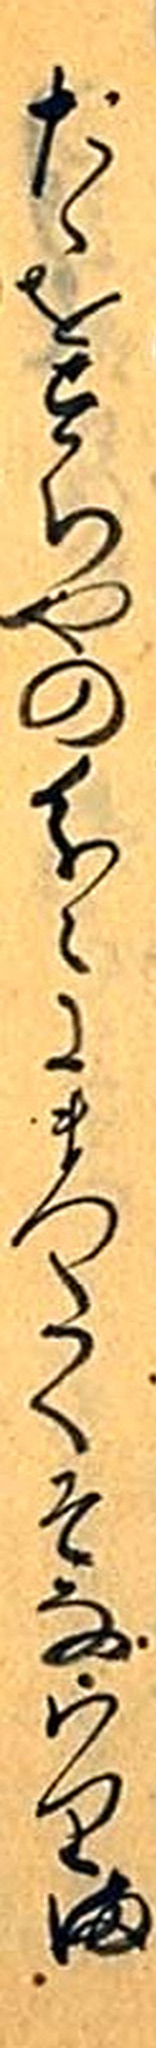たゝをすちやの分々にまつたくそなはりま
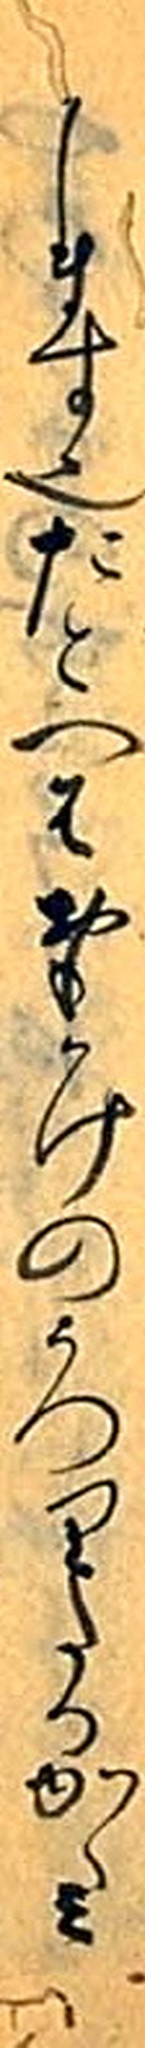します也たとへはおもかけのうつりたるかゝみ
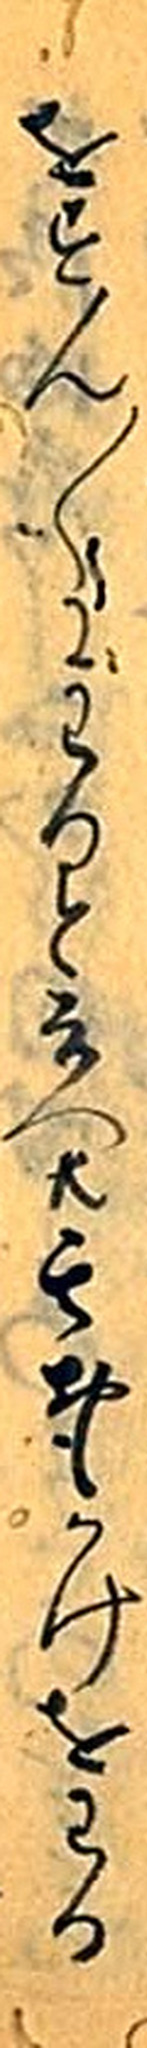をすん〳〵にわると云へ共其おもかけをわる
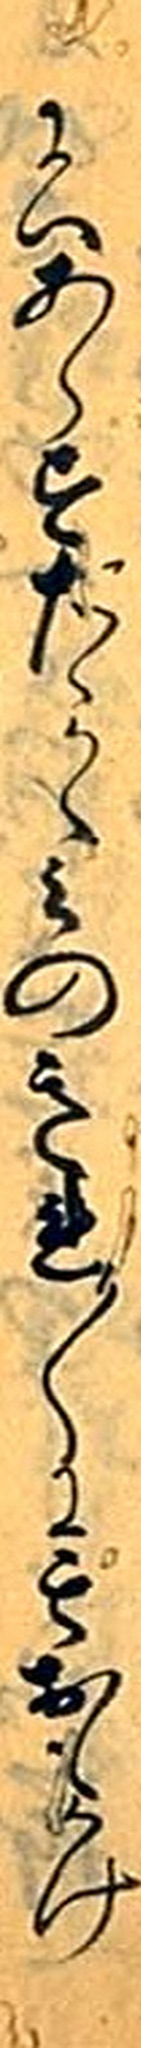にはあらすたゝかゝみのきれ〳〵に其おもかけ
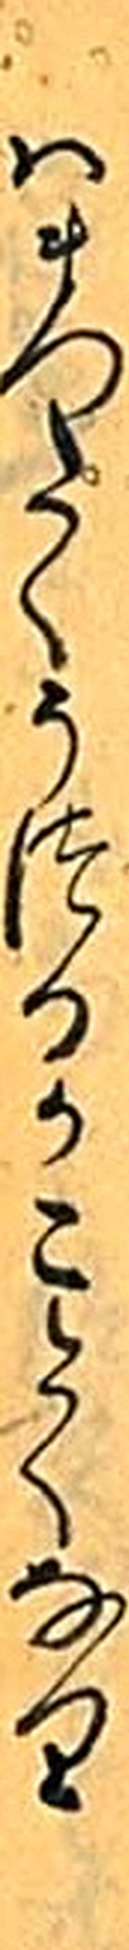はまつたくうつるかことくなり
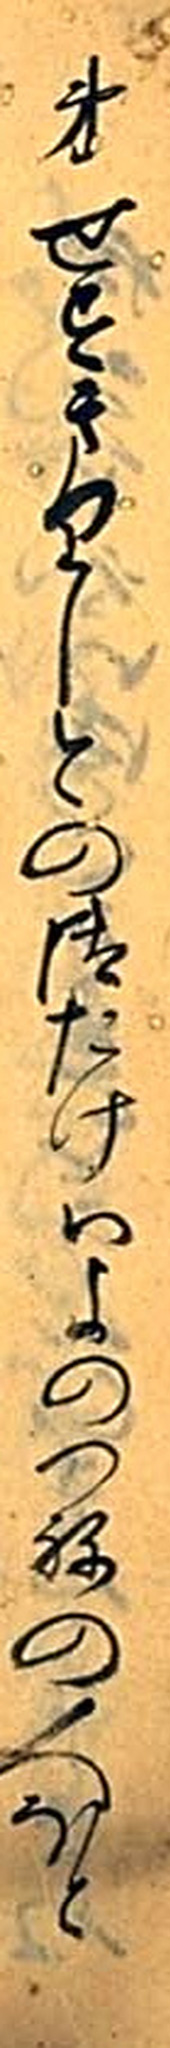弟せすきりしとの御たけはよのつねの人ほと
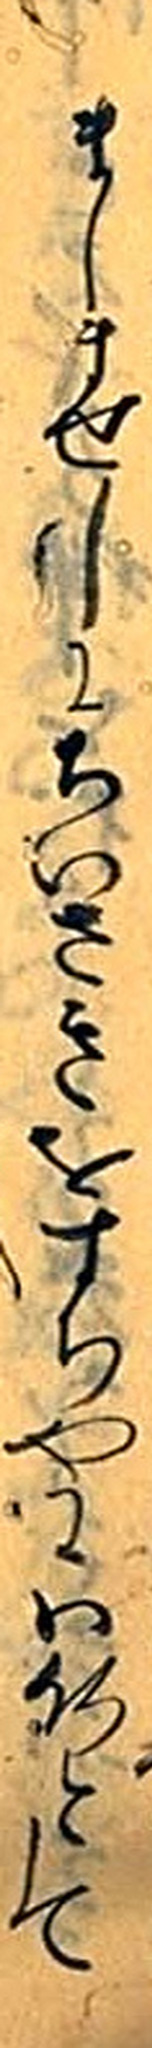ましませしにちいさきをすちやには何として
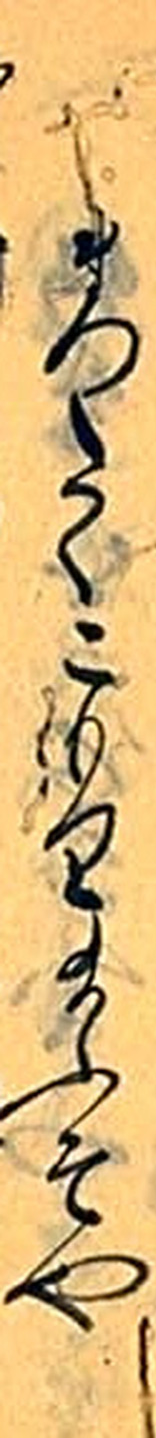まつたくこもり給ふそや
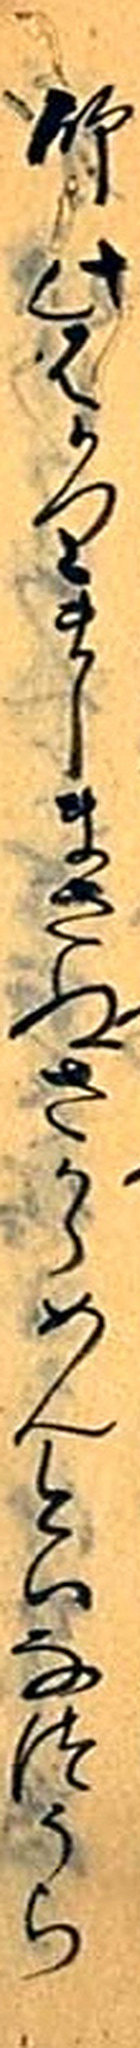師此はかりましまさぬさからめんとはなつうら
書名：ドチリナ・キリシタン
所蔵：東京大学総合図書館 / General Library in the University of Tokyo
